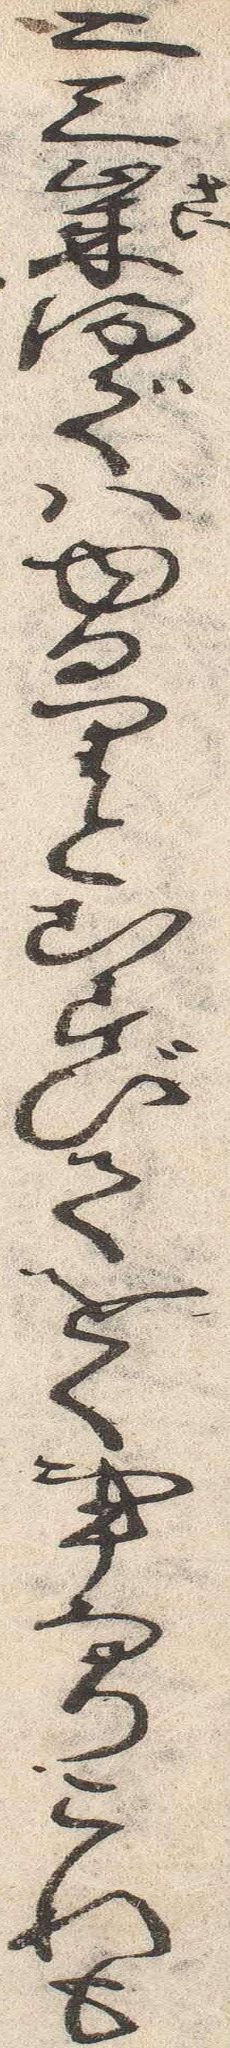二三歳まではゆるりとむすびてをく事なりこれも
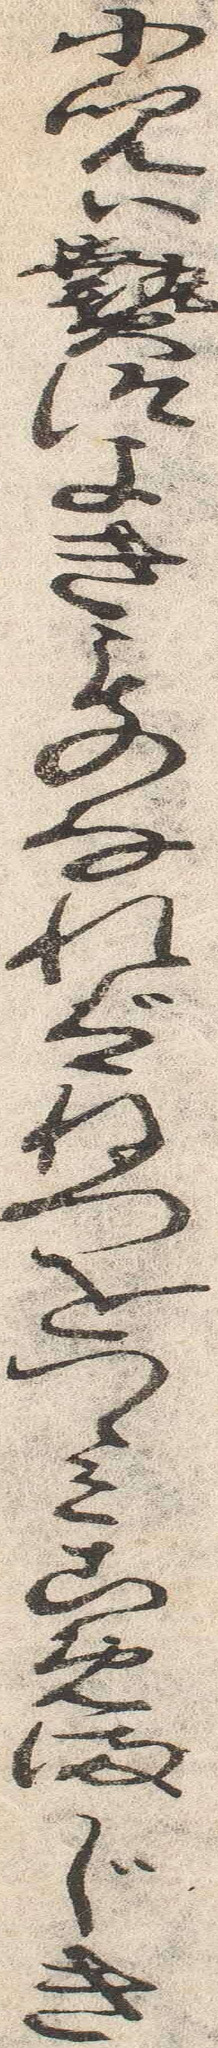小児は𤍽つよきものなればねつをつゝみこめまじき
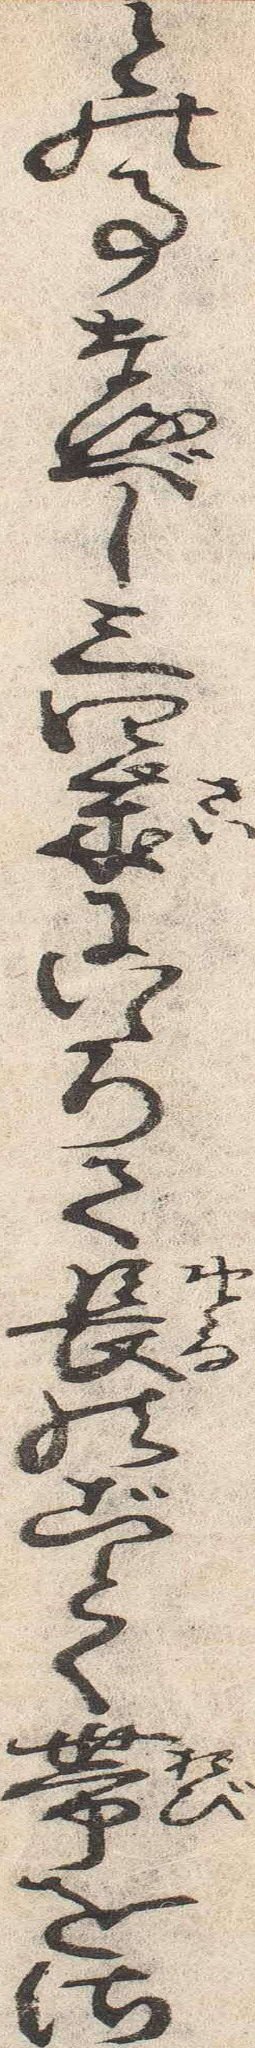との事たるべし三四歳にいたりて長のごとく帯をさ
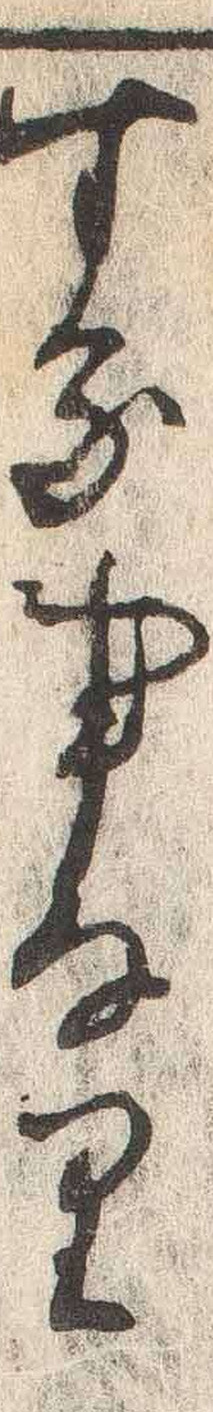する事なり
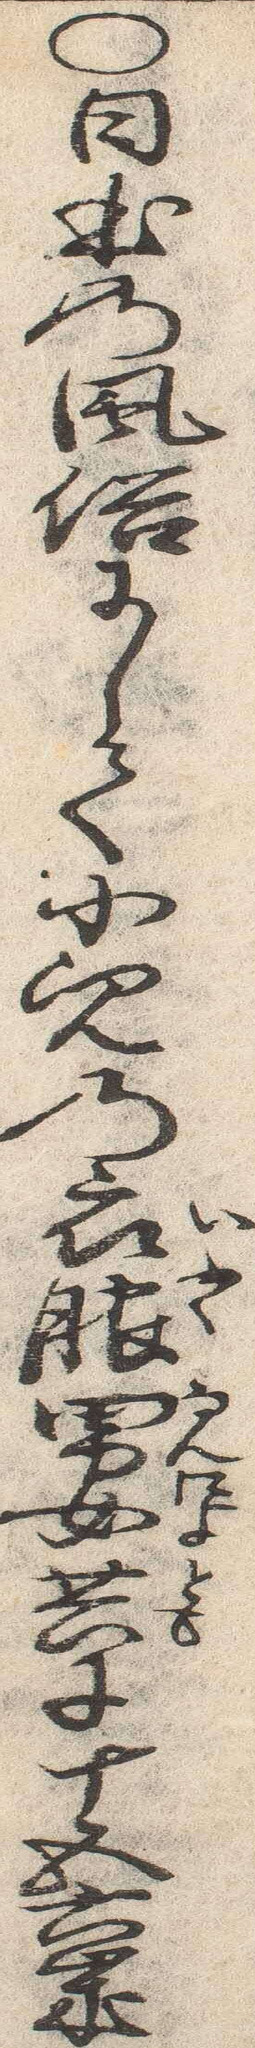◯日本の風俗にして小児の衣服男女共に十五六
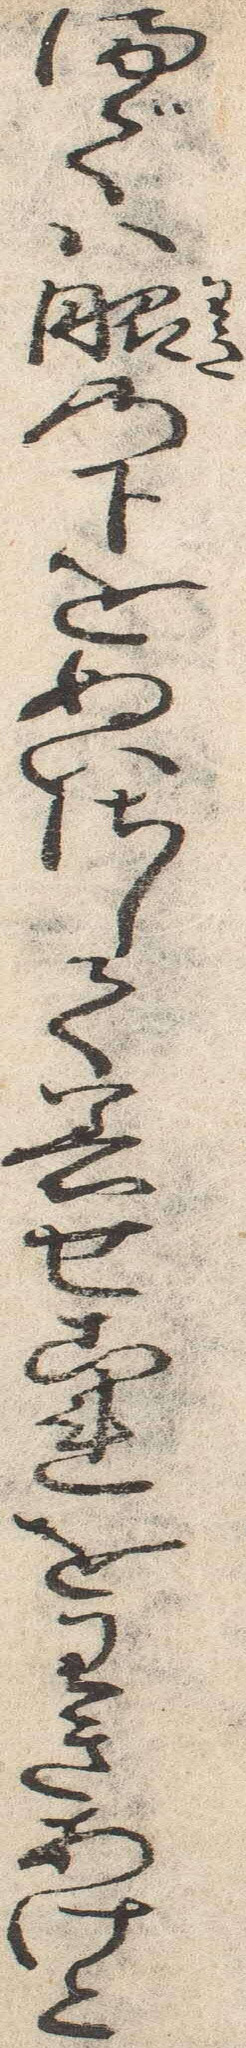までは脇の下をぬいさして着せこれをわきあけと
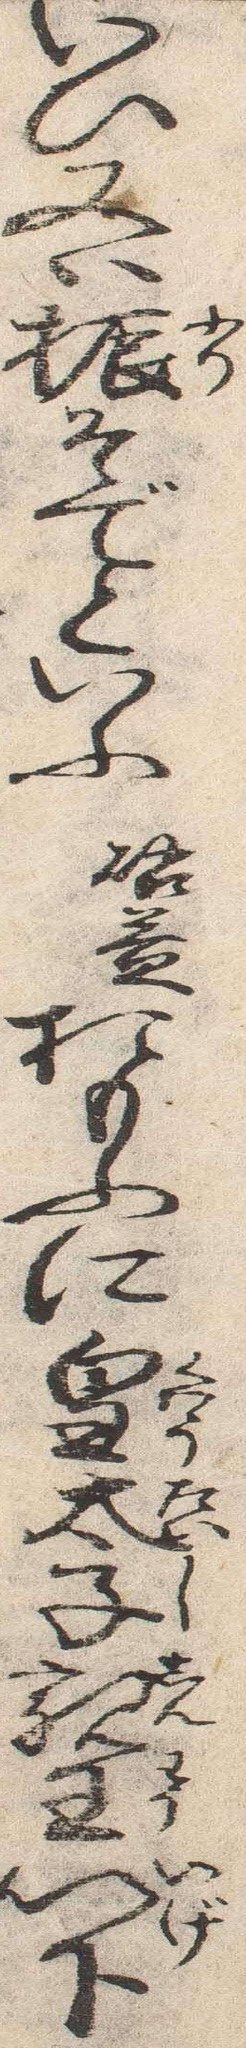いひ又は振そでといふ啓益おもふに皇太子親王以下
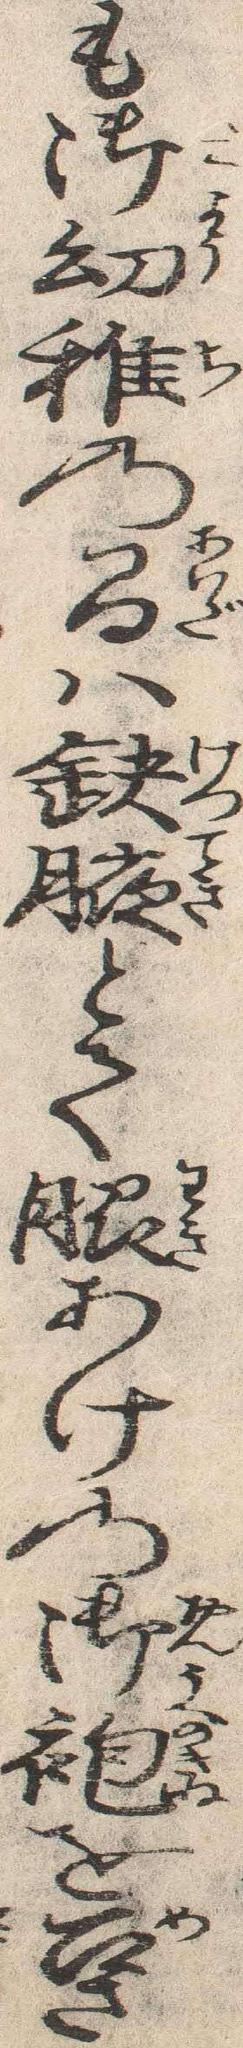も御幼稚の間は缺腋とて脇あけの御袍を召さ
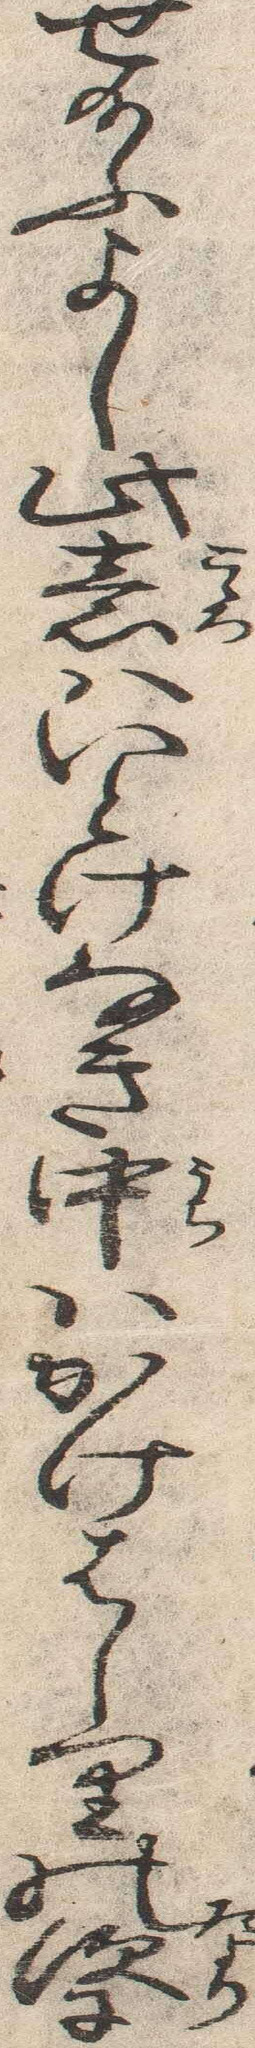せ給ふよし此意はいとけなき中はかけはしりの便に
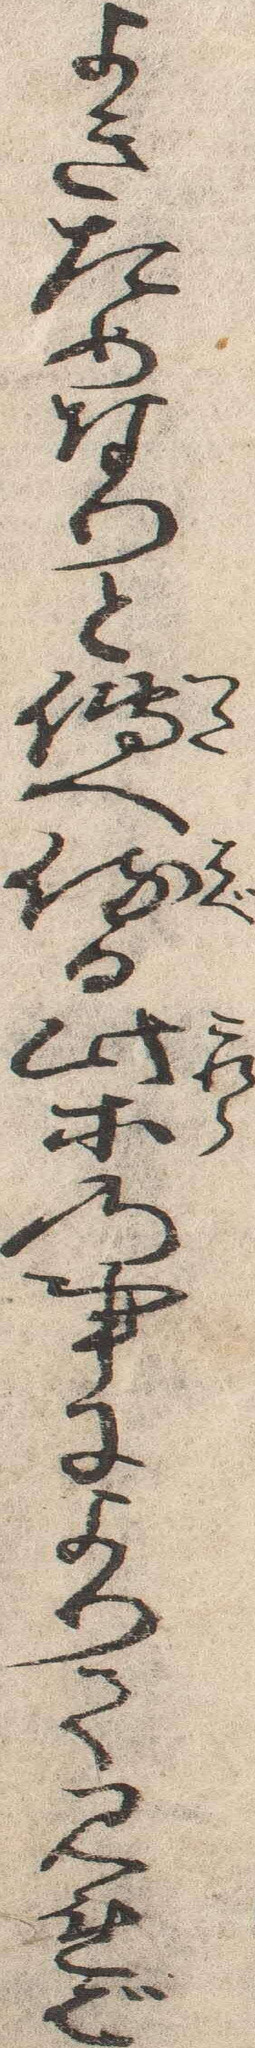よきためなりと傳へ侍る此等の事によりて見れば

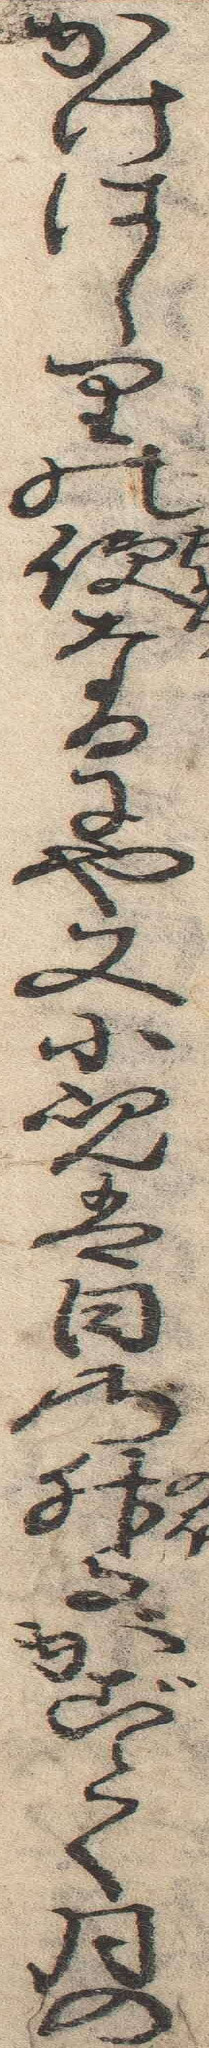かけはしりの便なるにや又小児は日の升るがごとく月の
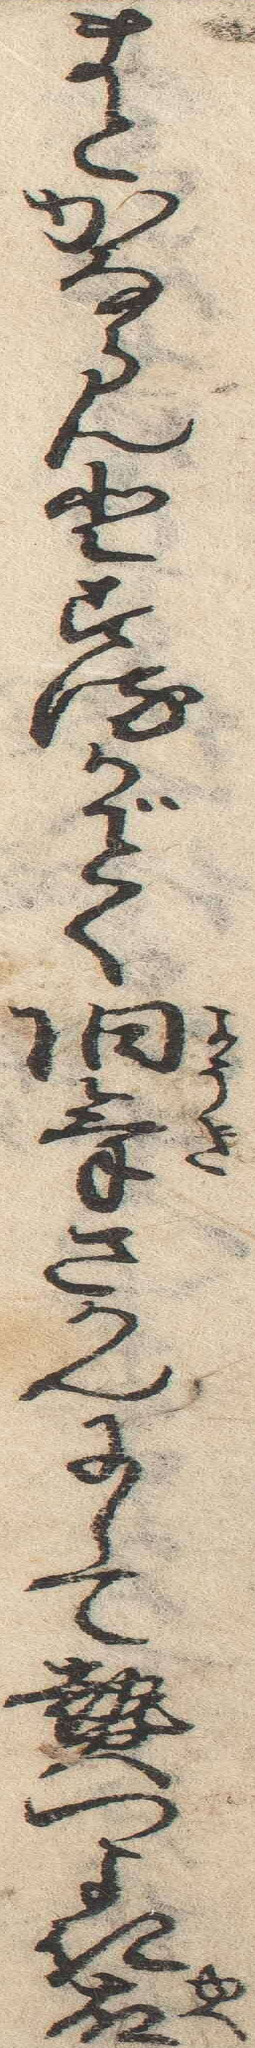まとかならんとするかごとく阳氣さかんにして𤍽つよき故
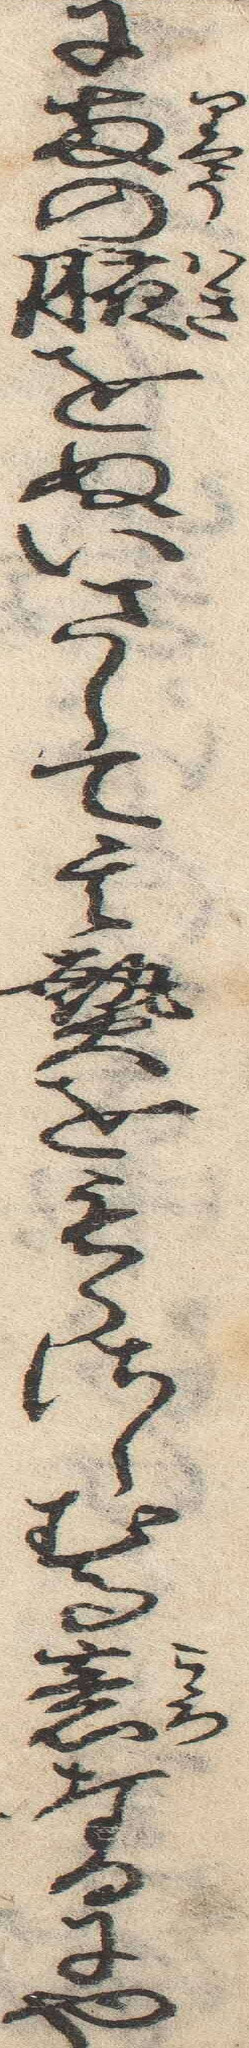に両の腋をぬいさして其𤍽をもらさしむる意なるにや
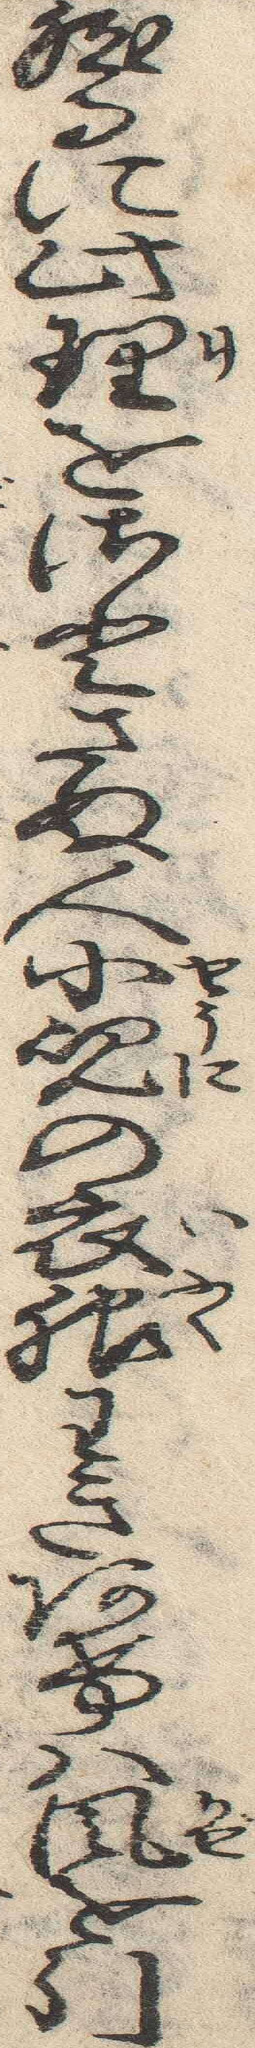然るに此理をさとさぬ人小児の衣服わきあけは風を引
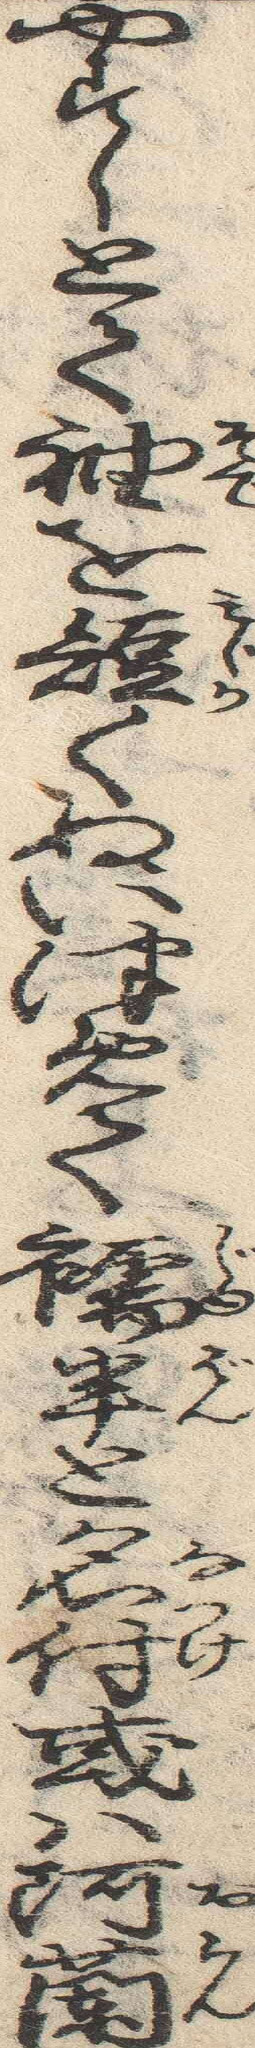やすしとて袖を短くぬいつめて襦半と名付或は阿蘭
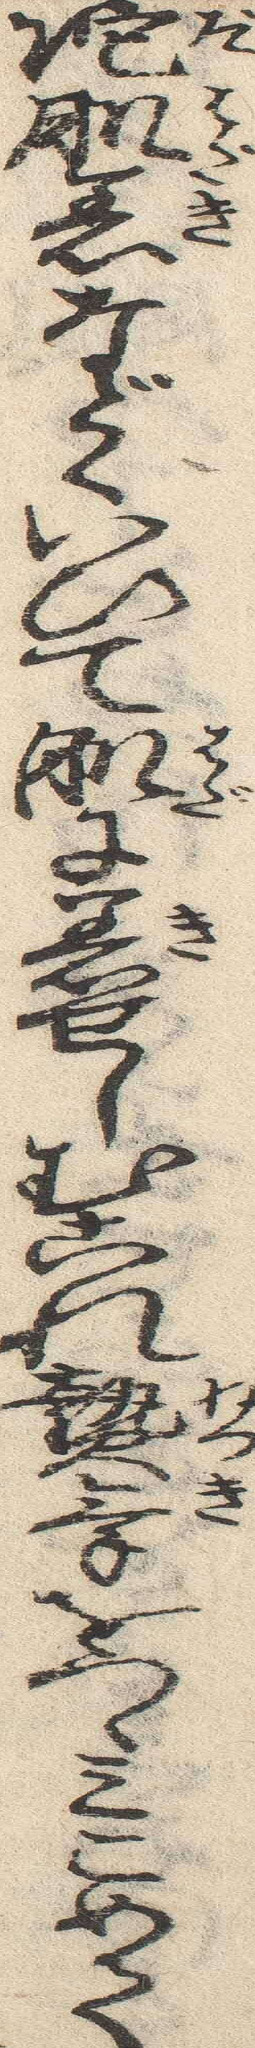陀肌着などゝいひて肌に着せしむこれ𤍽氣をつゝみこめて
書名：小児必用養育草
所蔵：東京学芸大学附属図書館 国文学研究資料館
